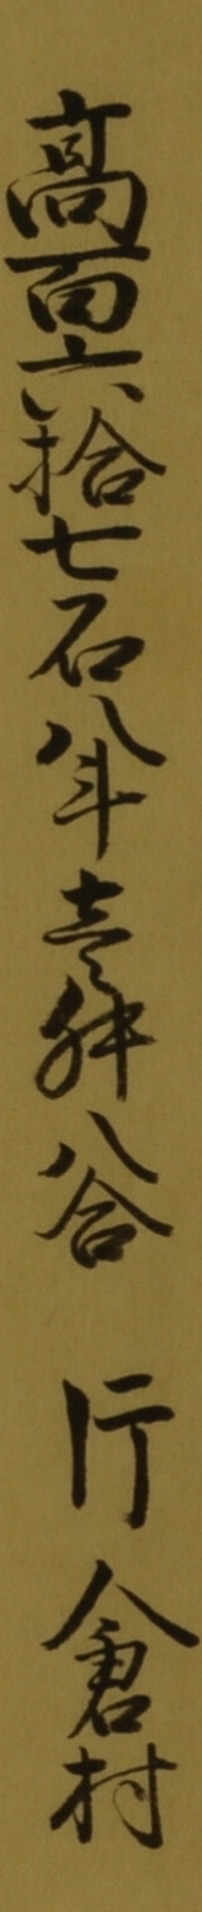一高百六拾七石八斗壱升八合片倉村
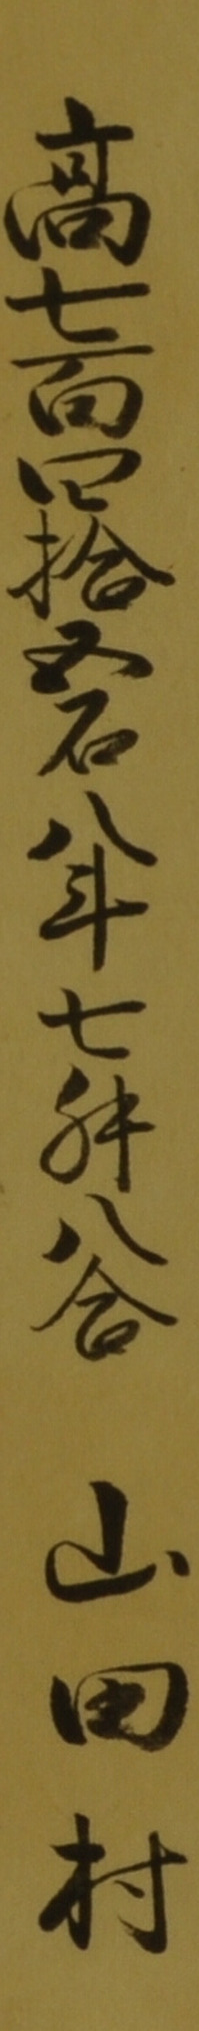一高七百四拾五石八斗七升八合山田村
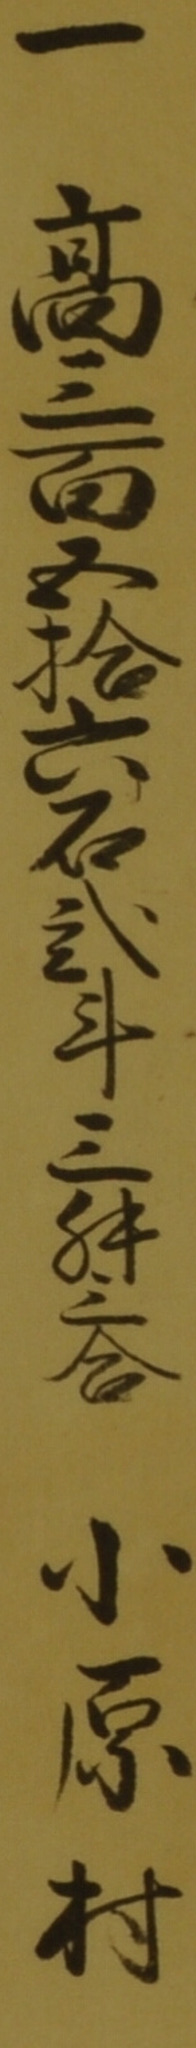一高三百五拾六石弐斗三升三合小原村
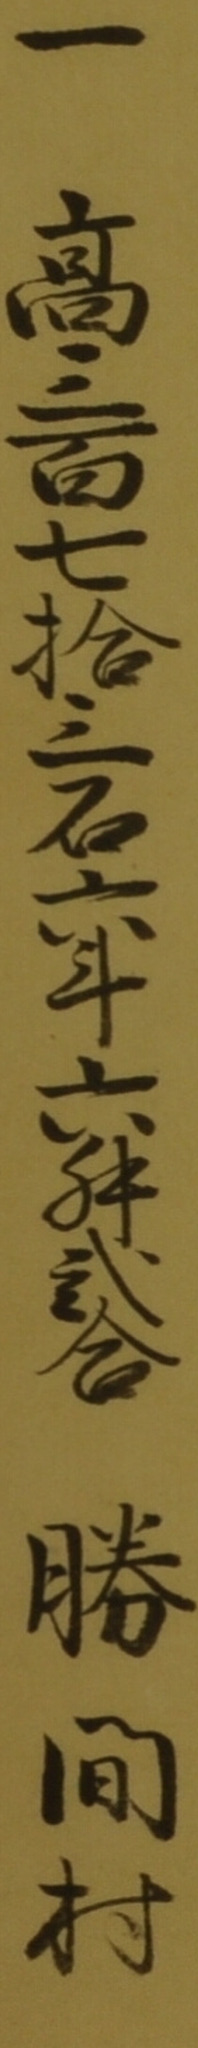一高三百七拾三石六斗六升弐合勝間村
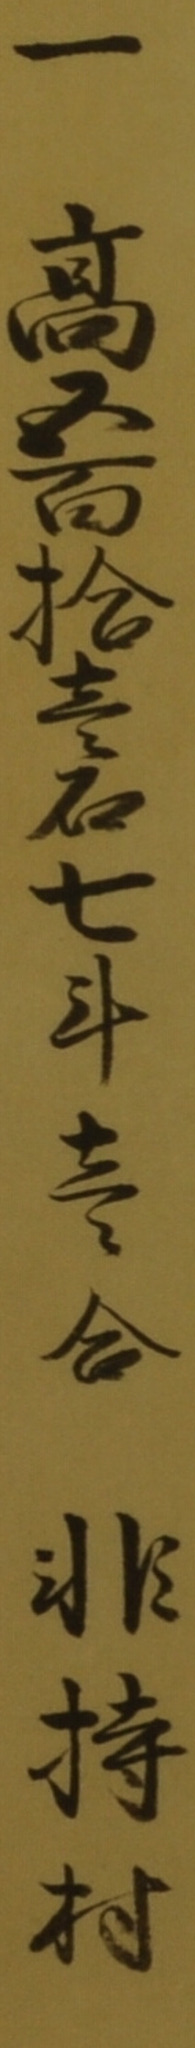一高五百拾壱石七斗壱合非持村

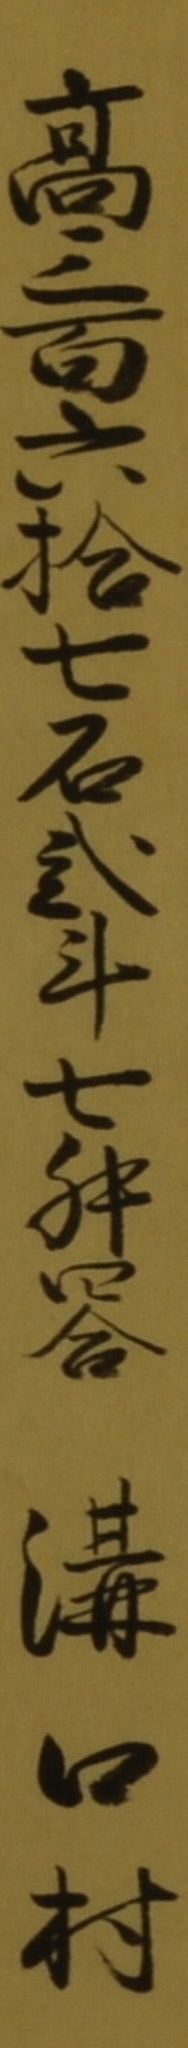一高三百六拾七石弐斗七升四合溝口村
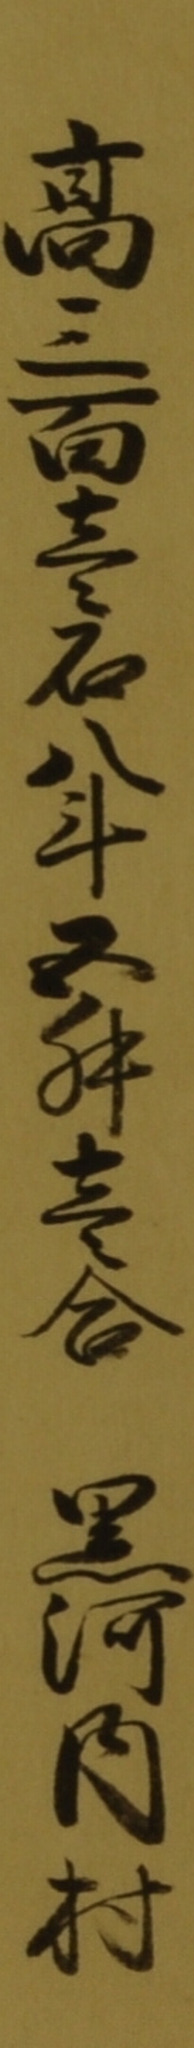一高三百壱石八斗五升壱合黒河内村
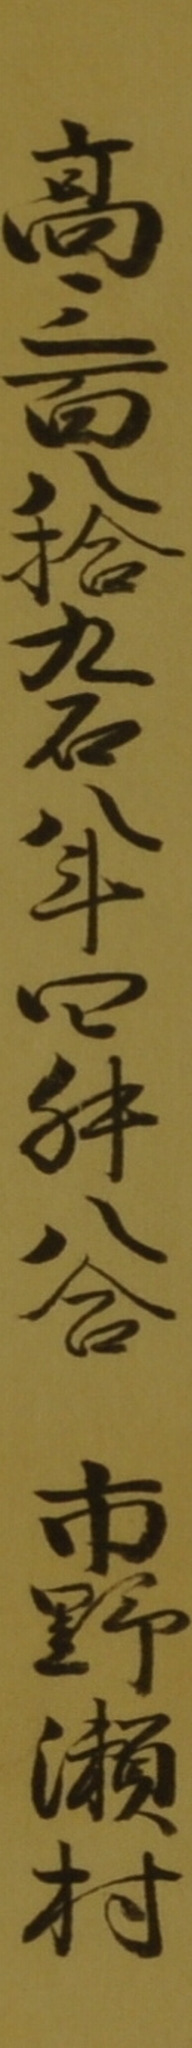一高三百八拾九石八斗四升八合市野瀬村
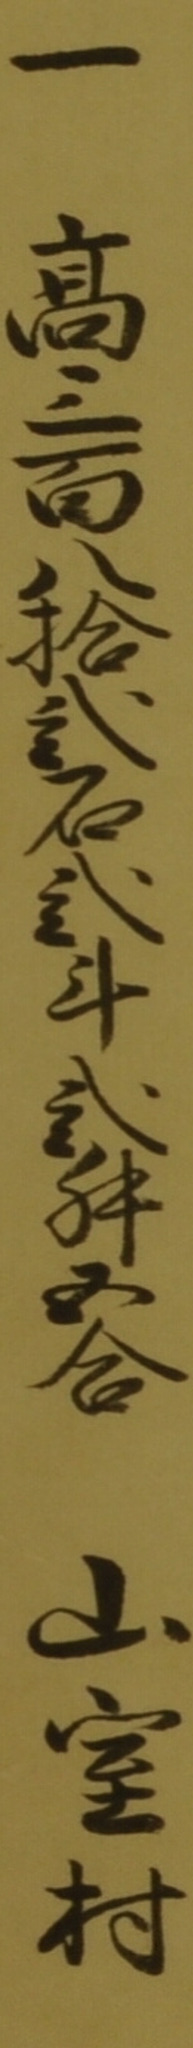一高三百八拾弐石弐斗二升五合山室村

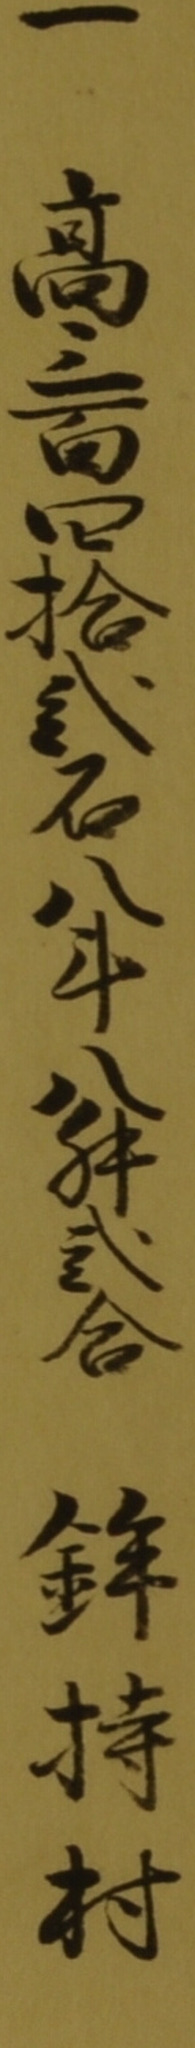一高三百四拾弐石八斗八升弐合鉾持村
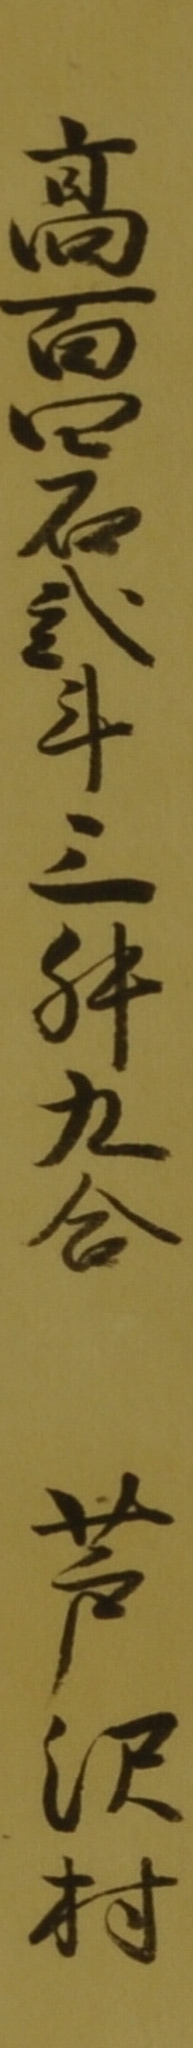一高百四石弐斗三升九合芦沢村
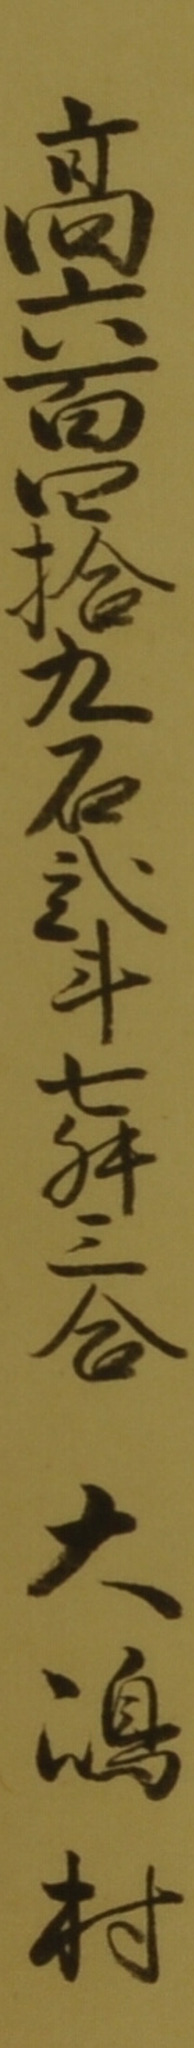一高六百四拾九石弐斗七升三合大島村
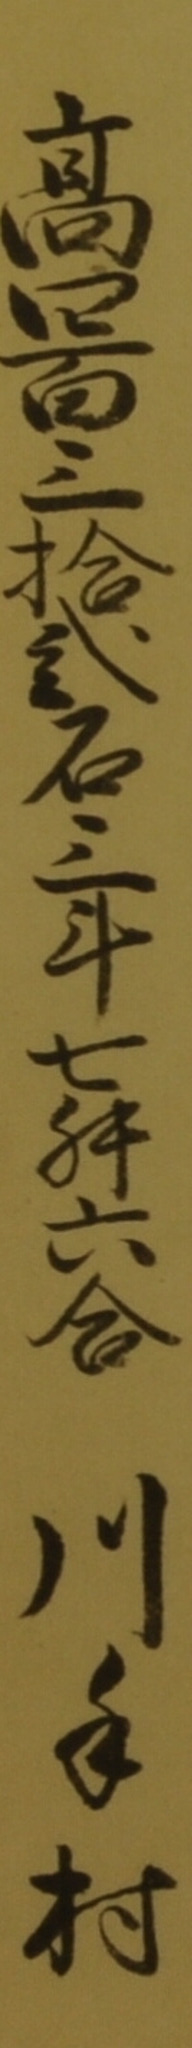一高四百三拾弐石三斗七升六合川手村

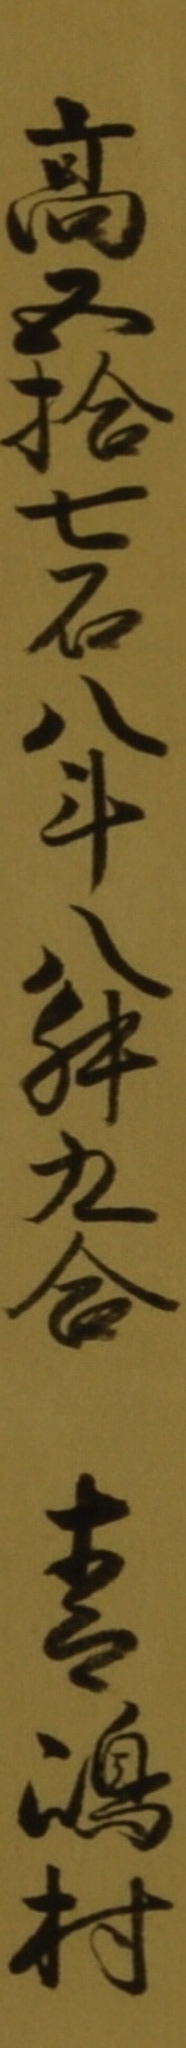一高五拾七石八斗八升九合青島村
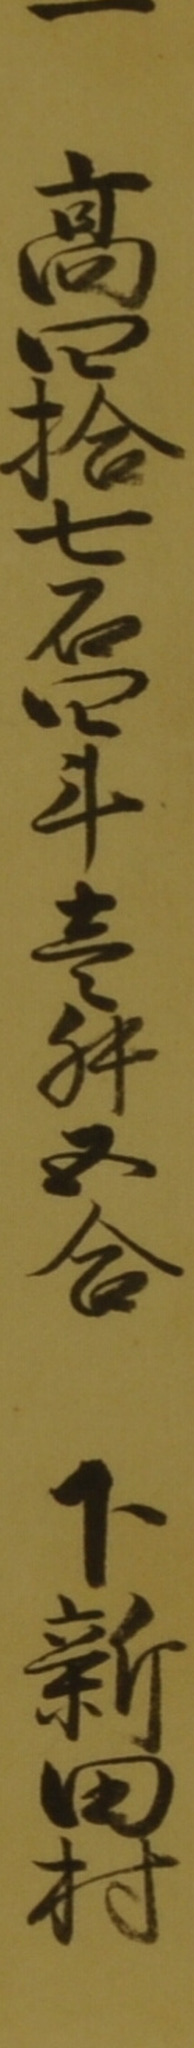一高四拾七石四斗壱升五合下新田村
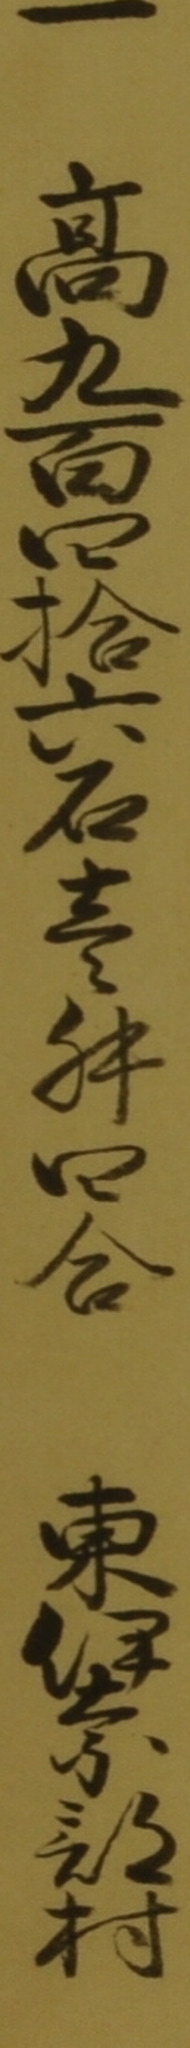一高九百四拾六石壱升四合東伊奈部村
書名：信濃国伊那郡筑摩郡高遠領知郷村高辻帳
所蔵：伊那市立高遠町図書館・合同会社AMANE
